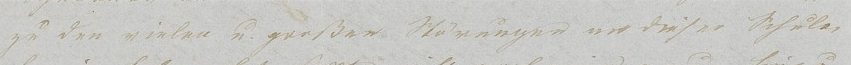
zu den vielen u. großen Störungen an dieser Schule,
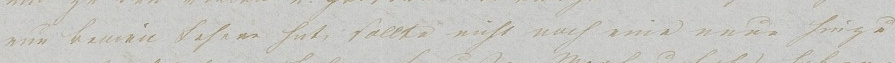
nun keinen Lehrer hat, sollte nicht noch eine neue hinzu
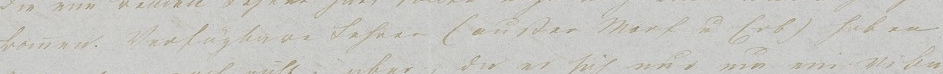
kommen. Verfügbare Lehrer (außer Morf u. Erb) haben
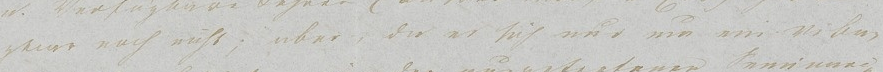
zwar noch nicht; aber, da es sich nur um ein Vika-
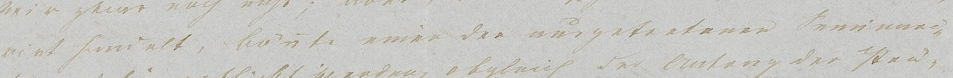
riat handelt, könnte einer der ausgetretenen Seminari-
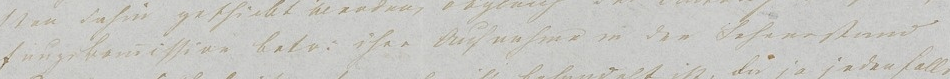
fungskommissionbetr: ihre Aufnahme in den Lehrerstand
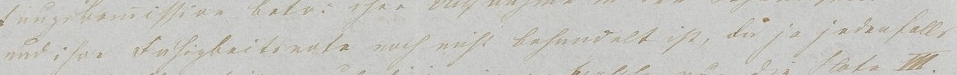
und ihre Fähigkeitsnote noch nicht behandelt ist, da ja jedenfalls
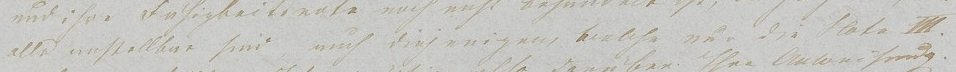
alle anstellbar sind, auch diejenigen, welche nur die Note III.
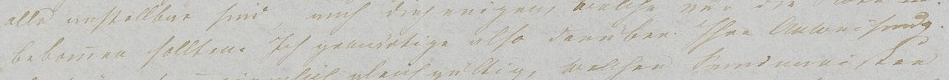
bekommen sollten. Ich gewärtige also daneben Ihre Anweisung.
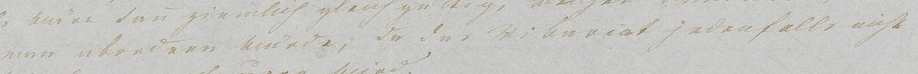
man abordnen würde, da das Vikariat jedenfalls nicht
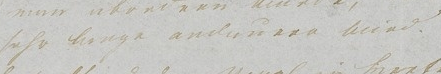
sehr lange andauern wird.
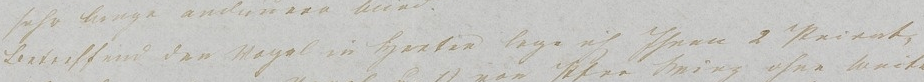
Betreffend den Vogel inHerten lege ich Ihnen 2 Privat-
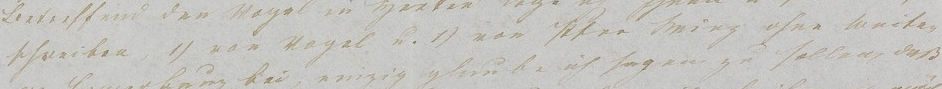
schreiben, 1) von Vogel u. 1) von Pfrr Wirz ohne weite-
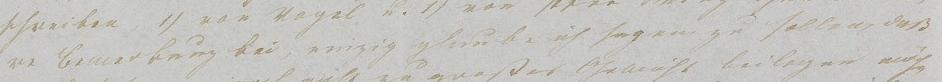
re Bemerkung bei, einzig glaube ich sagen zu sollen, daß
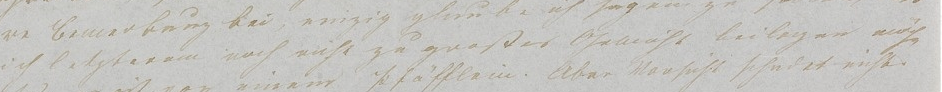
ich letzterem noch nicht zu großes Gewicht beilegen möch-
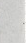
nicht.
